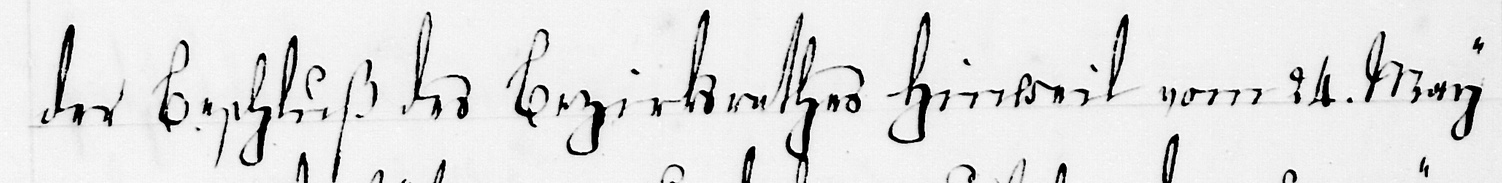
der Beschluß des Bezirksrathes Hinweil vom 24. May
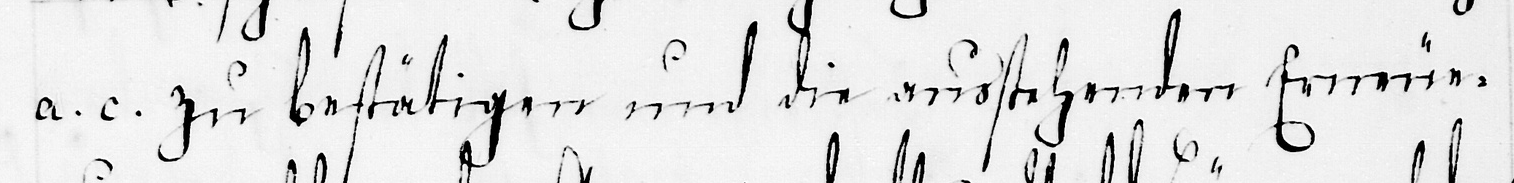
a. c. zu bestätigen und die ausstehenden Erneue¬
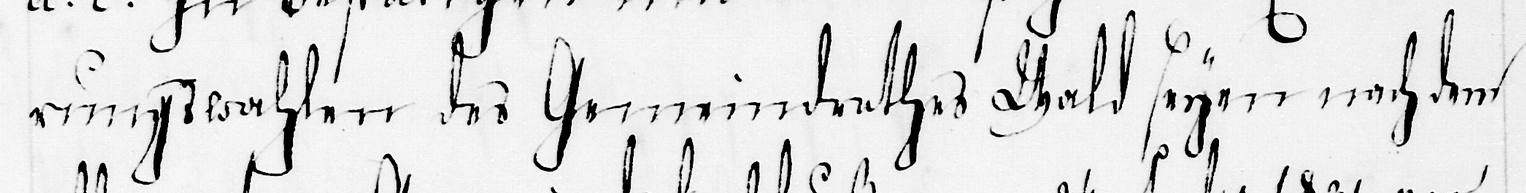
rungswahlen des Gemeindrathes Wald seyen nach dem
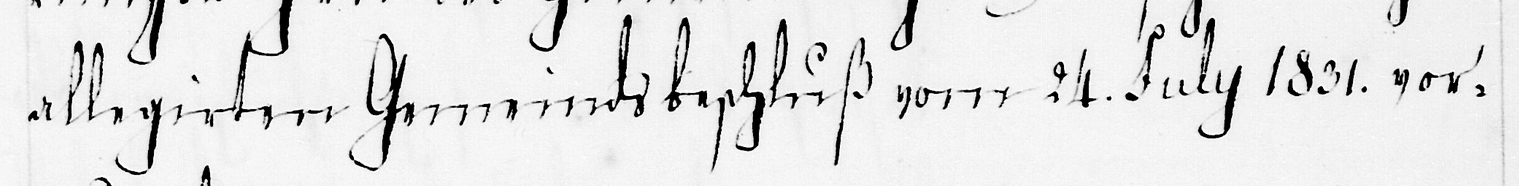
allegirten Gemeindsbeschluß vom 24. July 1831. vor¬
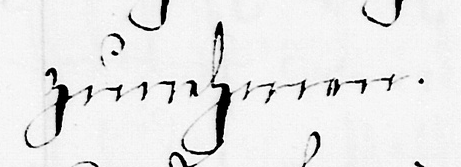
zunehmen.
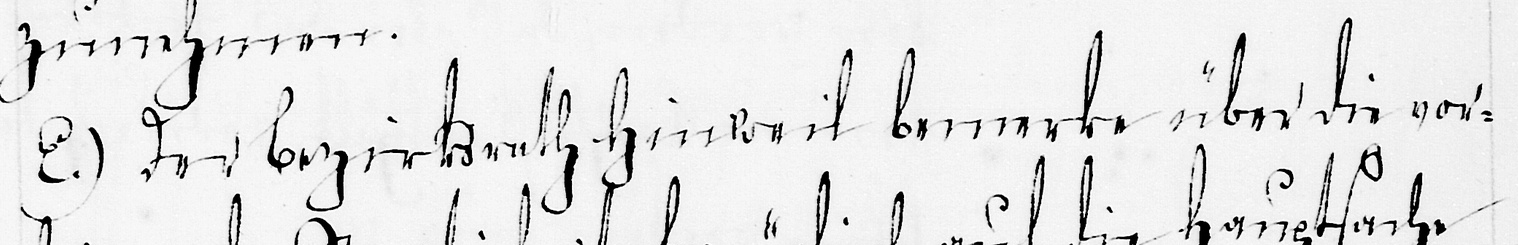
E.) Der Bezirksrath Hinweil bemerke über die vor¬
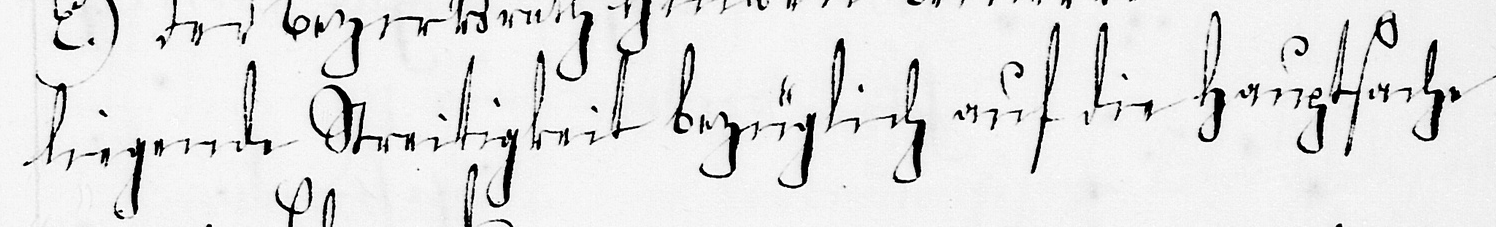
liegende Streitigkeit bezüglich auf die Hauptsache
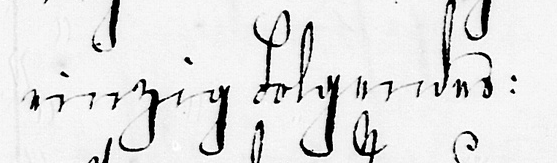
einzig Folgendes:
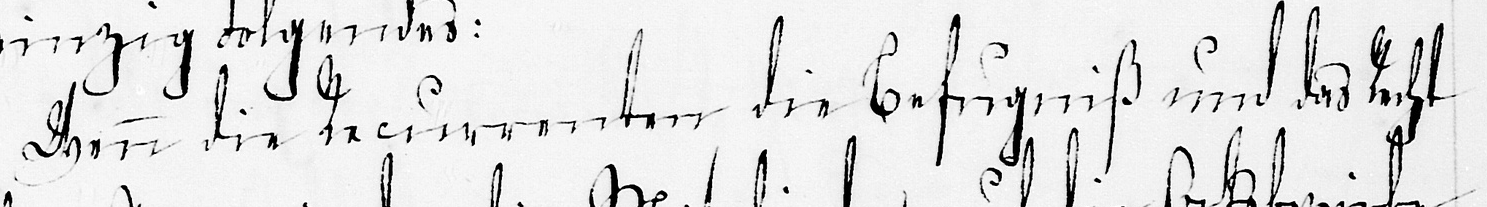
Wenn die Recurrenten die Befugniß und das Recht
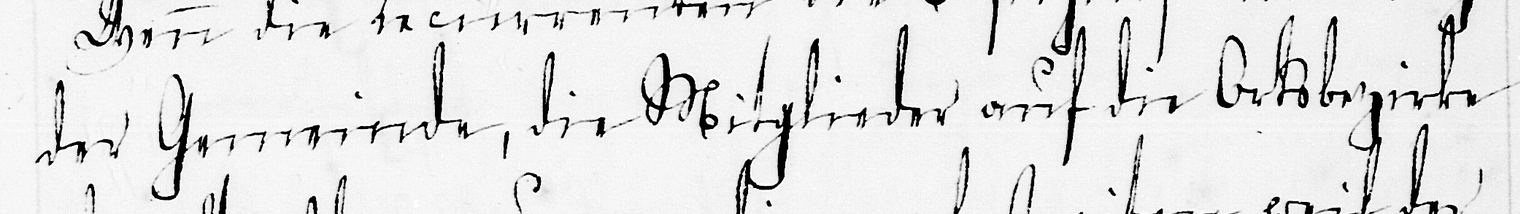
der Gemeinde, die Mitglieder auf die Ortsbezirke
